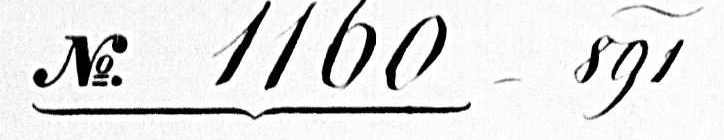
No. 1160 – 1891
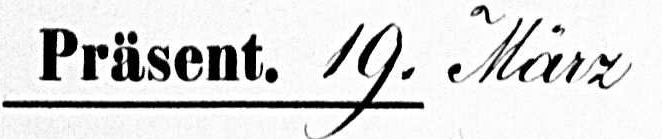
Präsent. 19. März
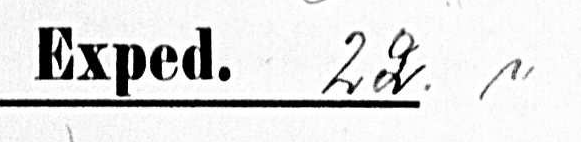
Expedit 23. „
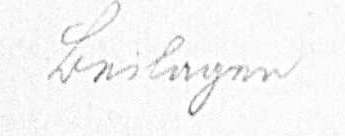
Beilagen
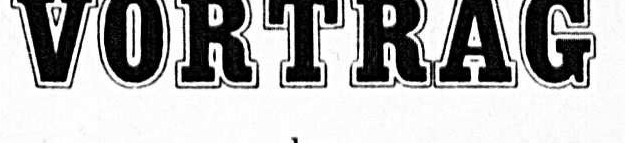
VORTRAG
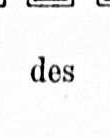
des
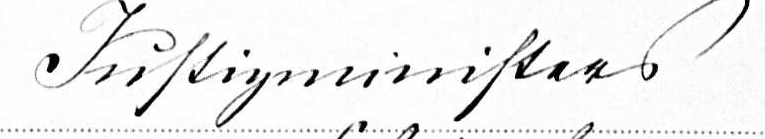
Justizministers
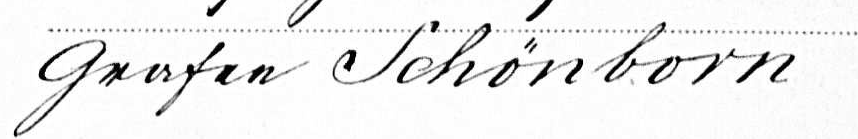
Grafen Schönborn
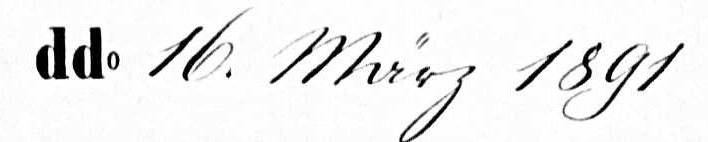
Ddo 16 März 1891
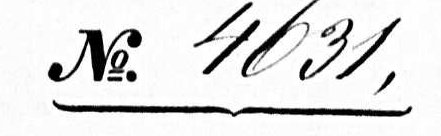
No 4631
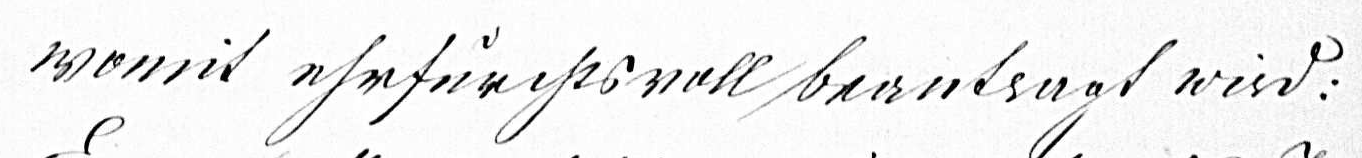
Womit ehrfürchtsvoll beantragt wird:
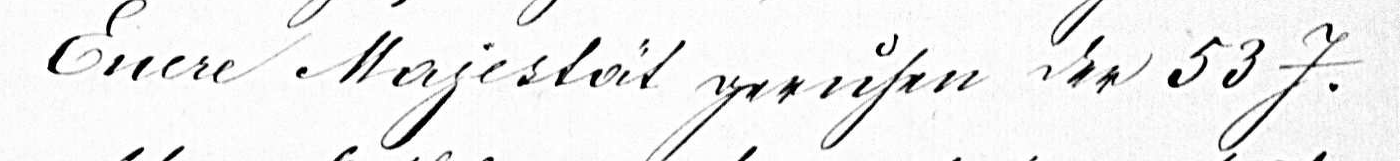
Euere Majestät geruhen der 53J
